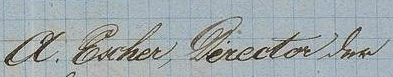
A. Escher, Director der
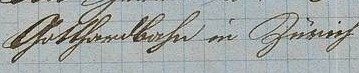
Gotthardbahn in Zürich.
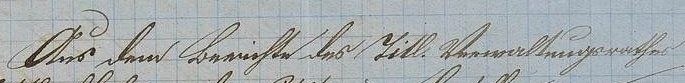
Aus dem Berichte des Titl. Verwaltungsrathes
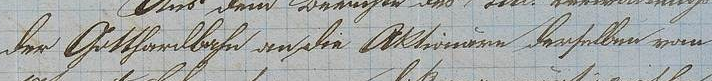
der Gotthardbahn an die Aktionäre derselben vom
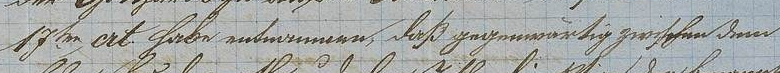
17ten crt. habe entnommen, daß gegenwärtig zwischen dem
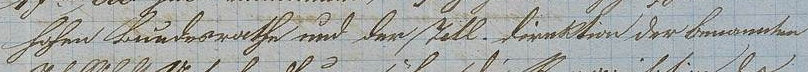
hohen Bundesrathe und der Titl. Direktion der benannten
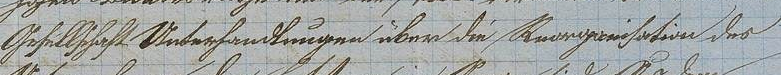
Gesellschaft Unterhandlungen über die Reorganisation des
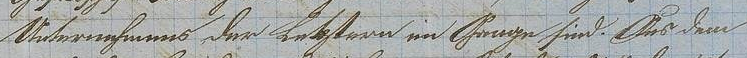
Unternehmens der Letztern im Gange sind. Aus dem
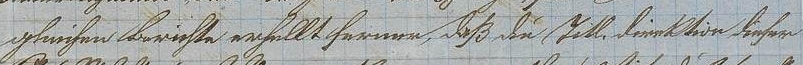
gleichen Berichte erhellt ferner, daß die Titl. Direktion dieser
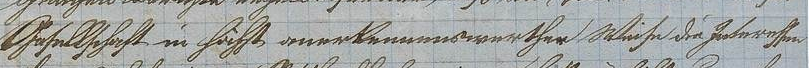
Gesellschaft in höchst anerkennenswerther Weise die Interessen
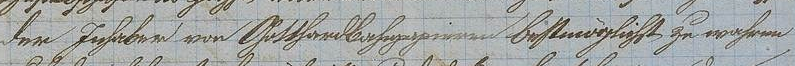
der Inhaber von Gotthardbahnpapieren bestmöglichst zu wahren
